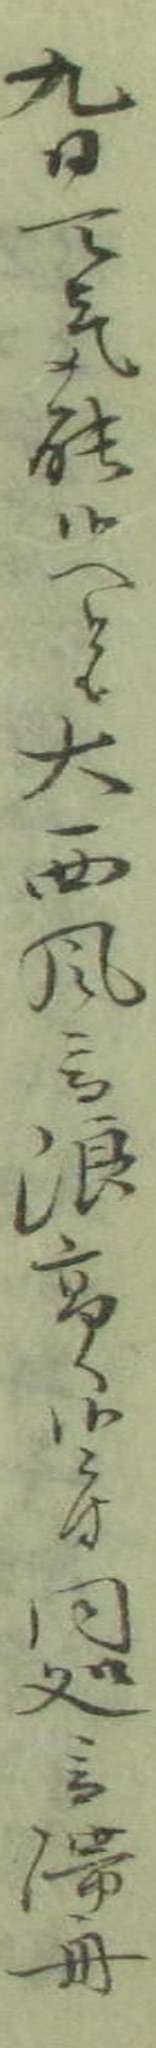九日天気能候へとも大西風に而浪高く候に付同処に而滞舟
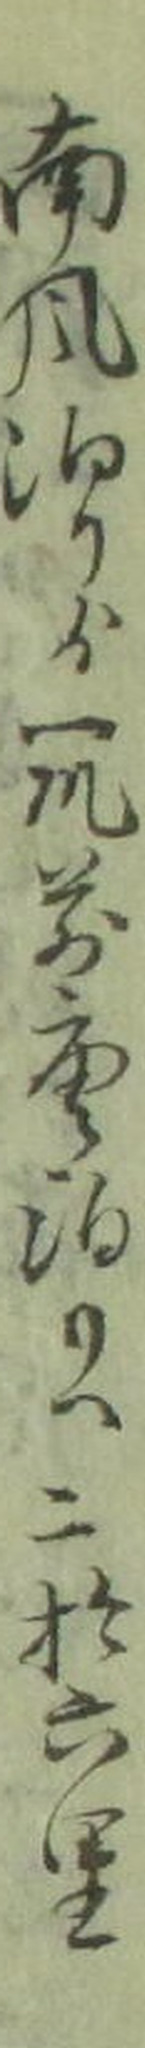南風泊りゟ筑前唐泊りへ二拾六里
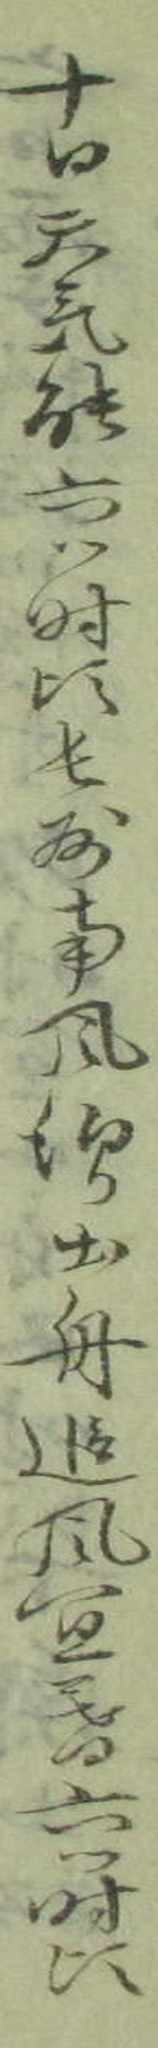十日天気能六ツ時頃長州南風泊り出舟追風宜暮六ツ時頃
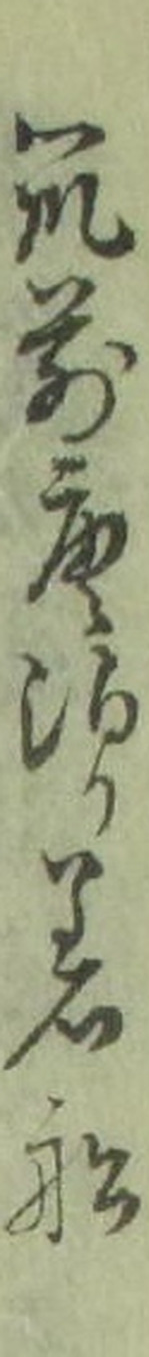筑前唐泊り着船
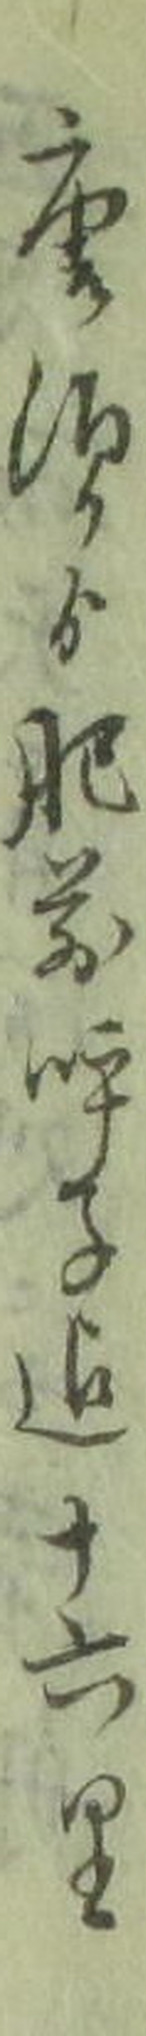唐泊りゟ肥前呼子迄十六里
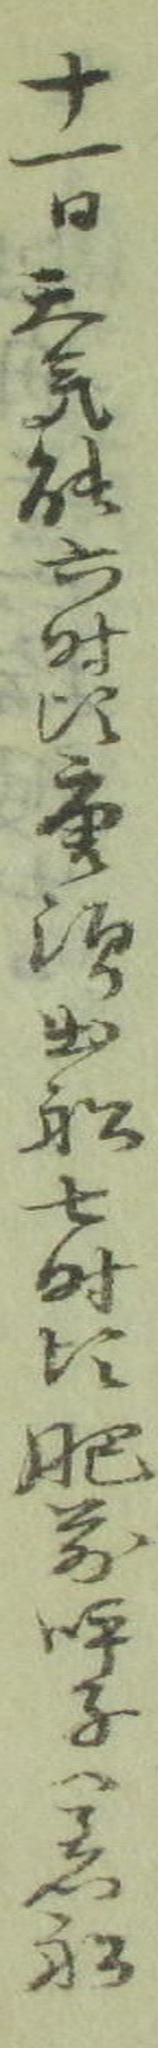十一日天気能六時頃唐泊り出船七時頃肥前呼子へ着船
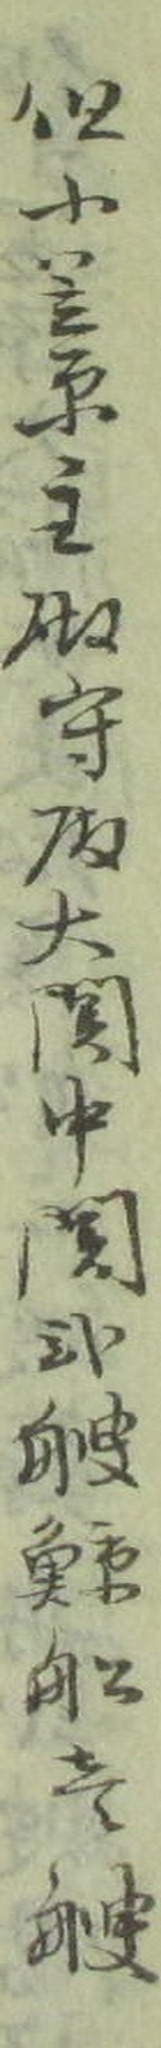但小笠原主殿守殿大関中関弐艘鯨船壱艘
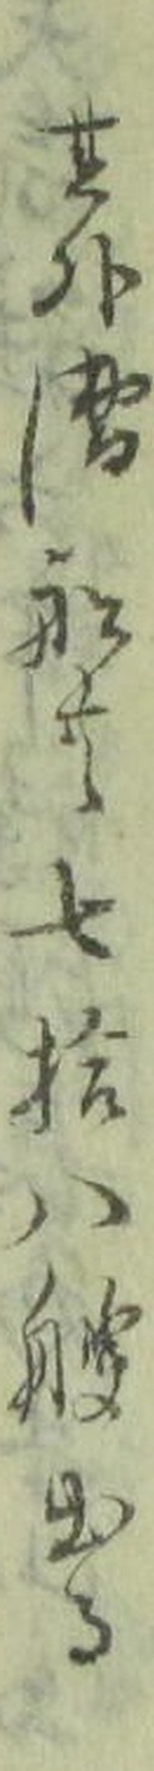其外漕船共七拾八艘出る
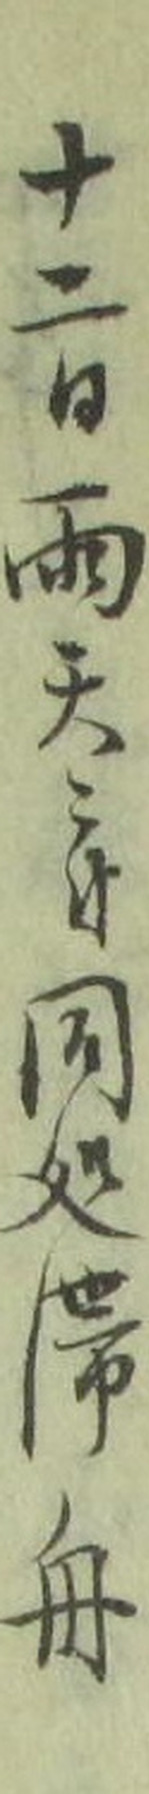十二日雨天に付同処滞舟
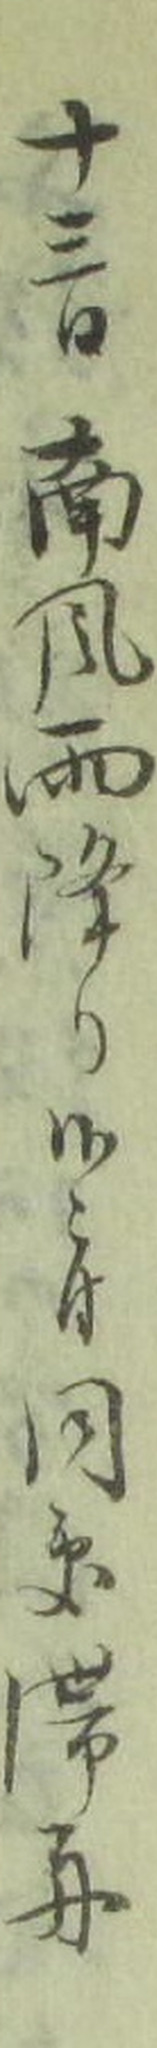十三日南風雨降り候に付同処滞舟
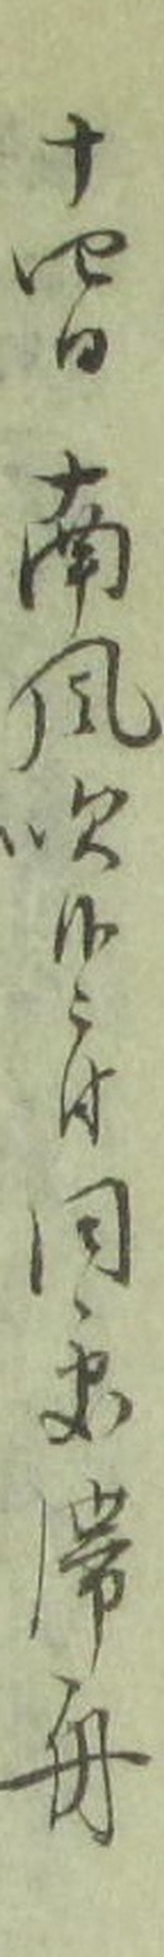十四日南風吹候に付同処滞舟
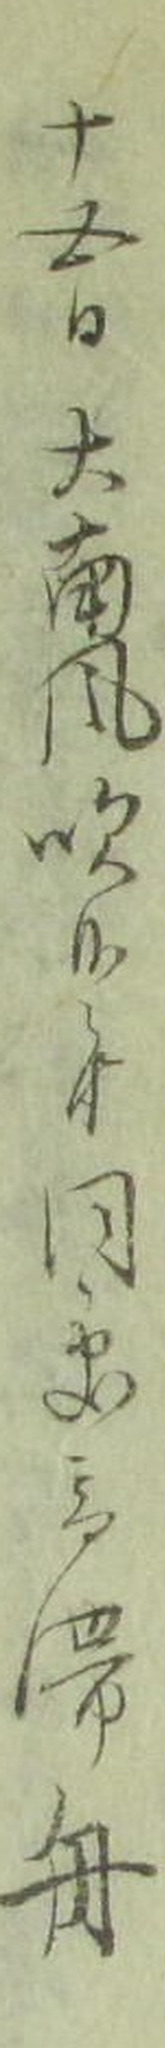十五日大南風吹候に付同処に而滞舟
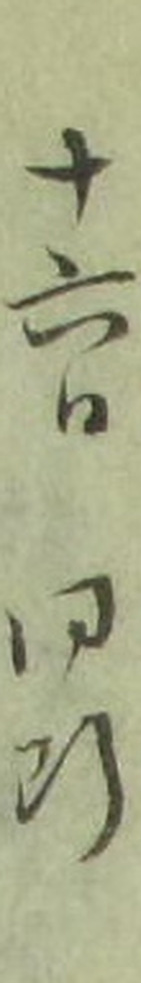十六日同断
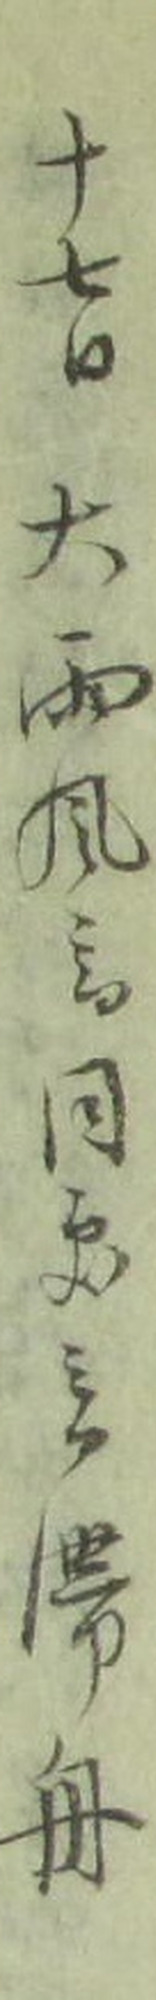十七日大雨風に而同処に而滞舟
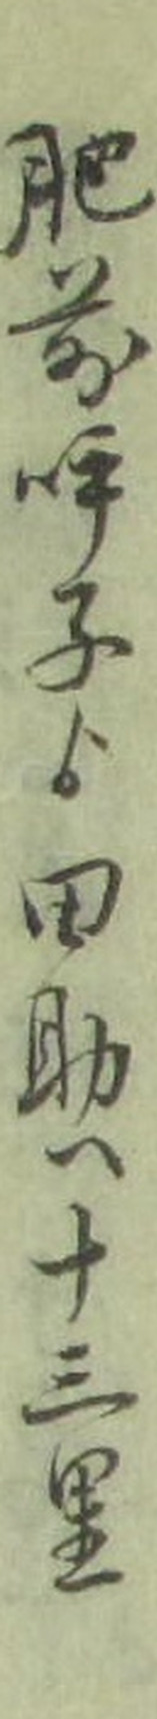肥前呼子ゟ田助へ十三里
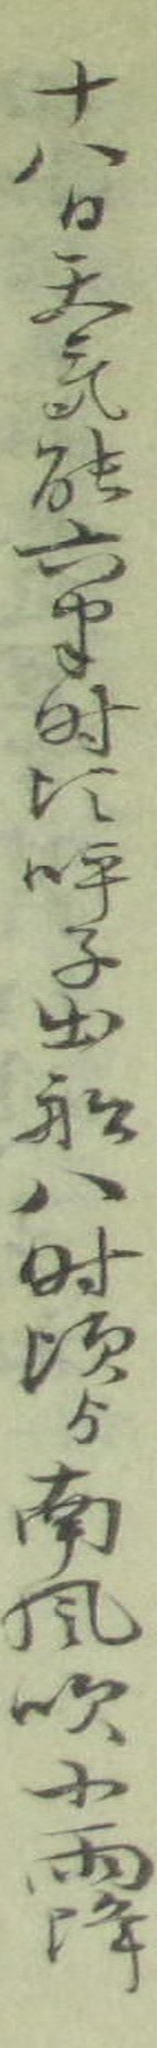十八日天気能六半時頃呼子出船八時頃ゟ南風吹小雨降
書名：紀州九木浦庄屋記録 四
